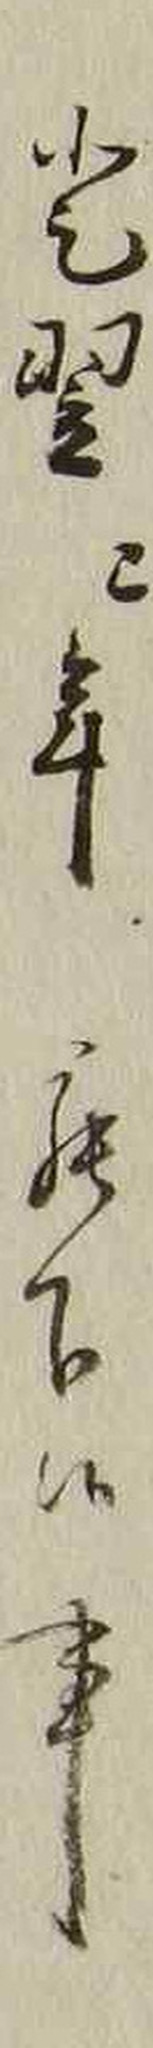登翌巳年罷下候事
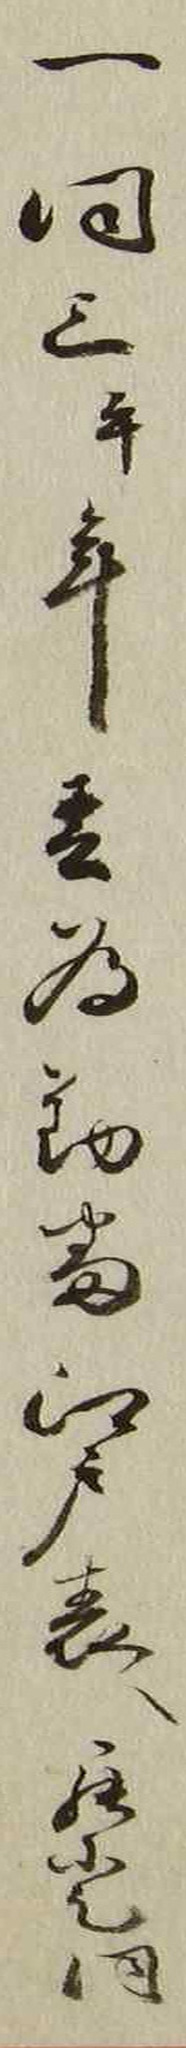一同三午年春為勤番江戸表へ罷登同
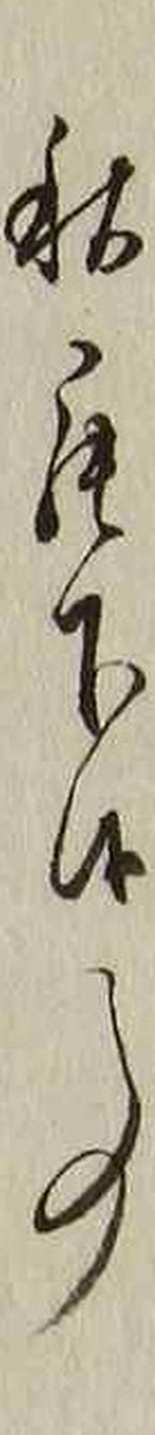秋罷下候事
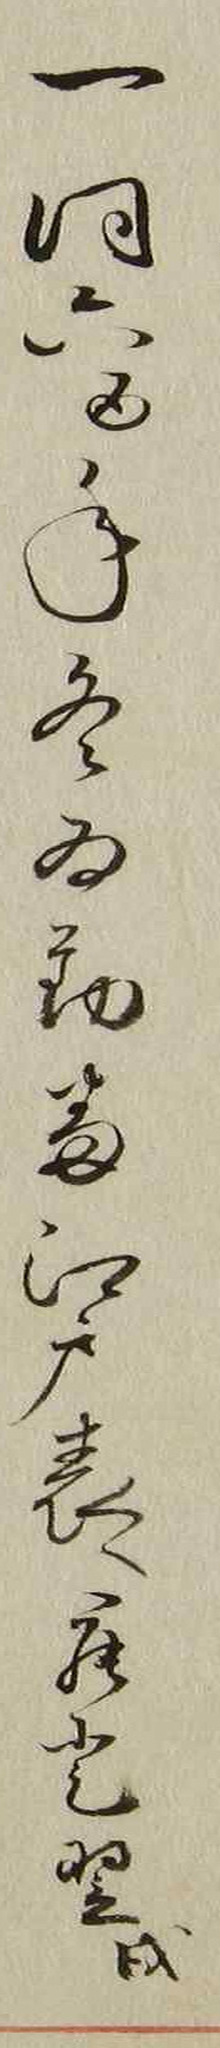一同六酉年冬為勤番江戸表へ罷登翌戌
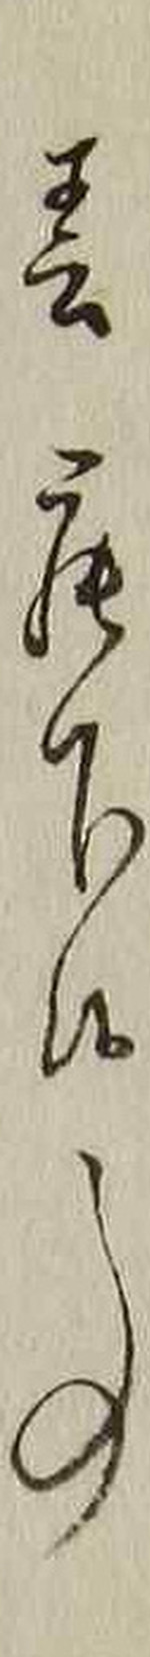春罷下候事
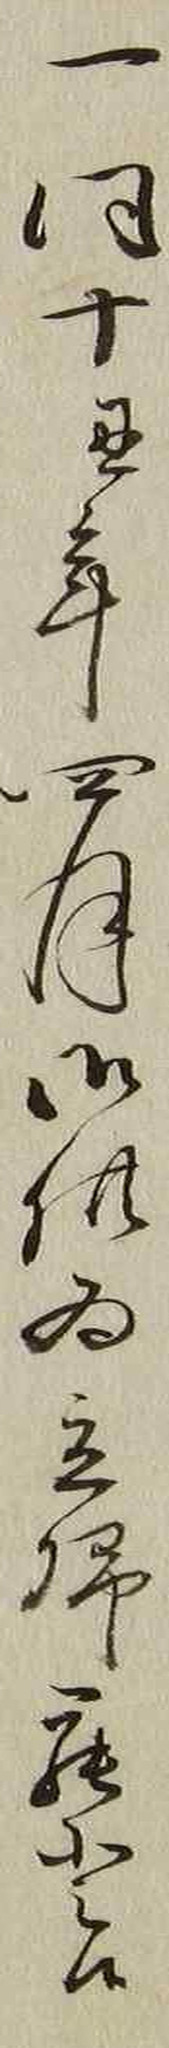一同十丑年四月御供為立帰罷登候
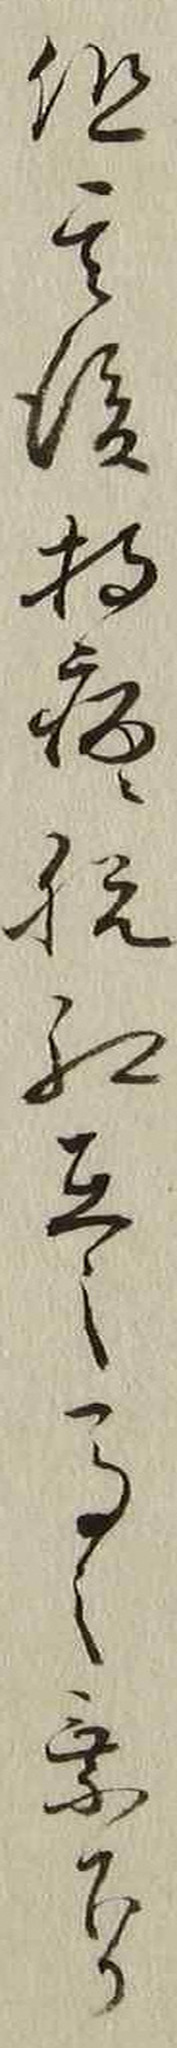但其後持病ニ脱肛在之馬之乗下り
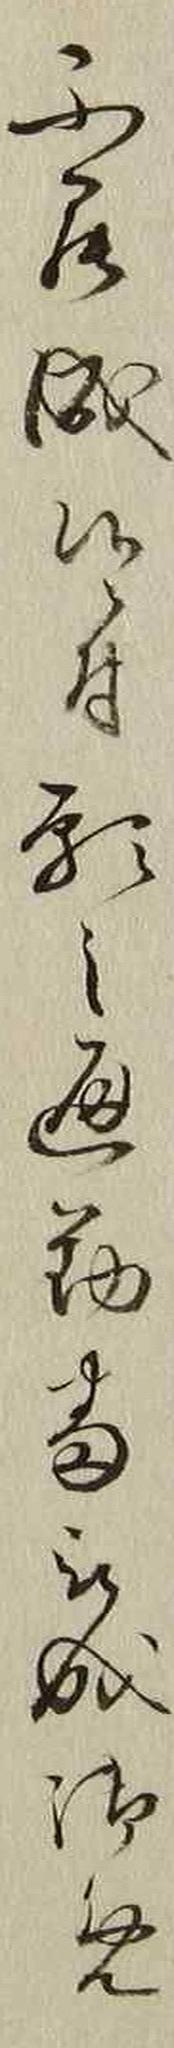不罷成候ニ付願之通勤番被成御免
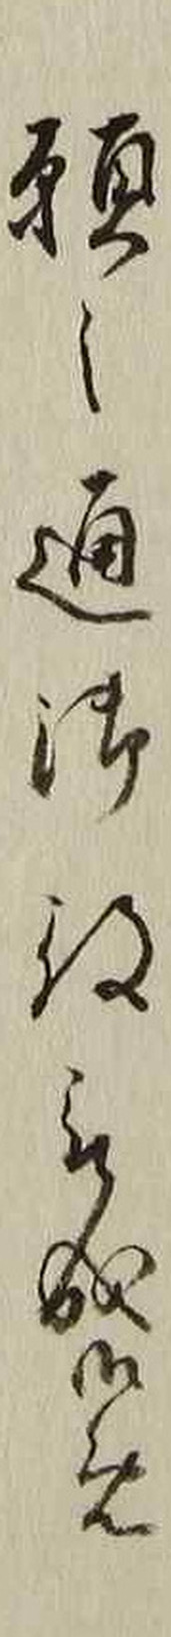詳願之通御役被成御免
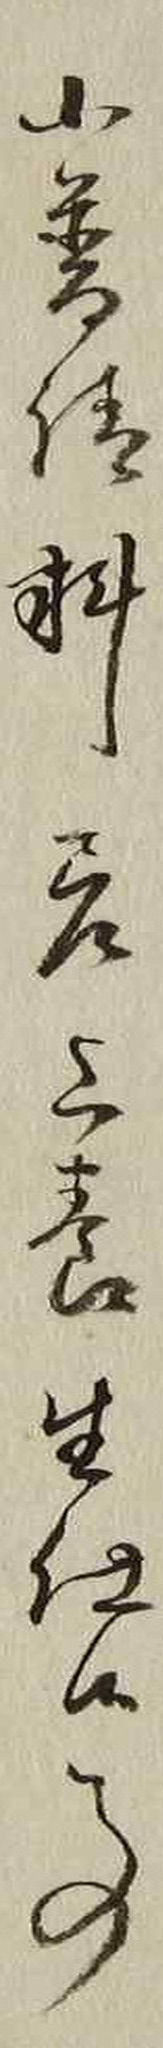小普請料差上養生仕候事
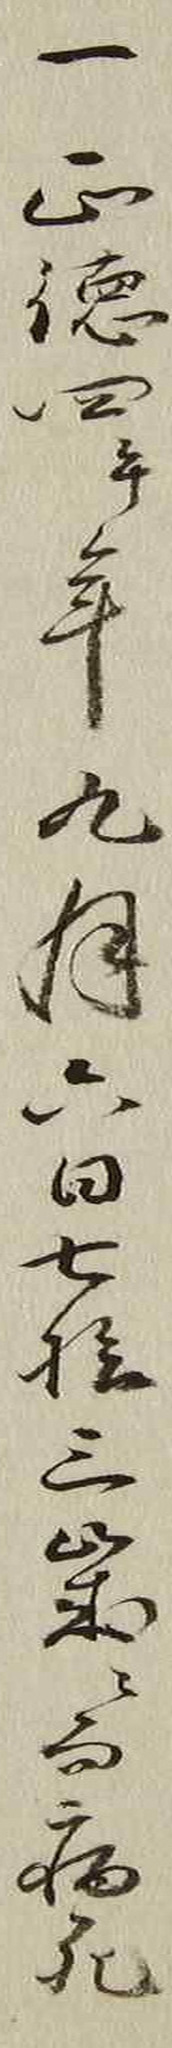一正徳四午年九月六日七拾三歳ニ而病死
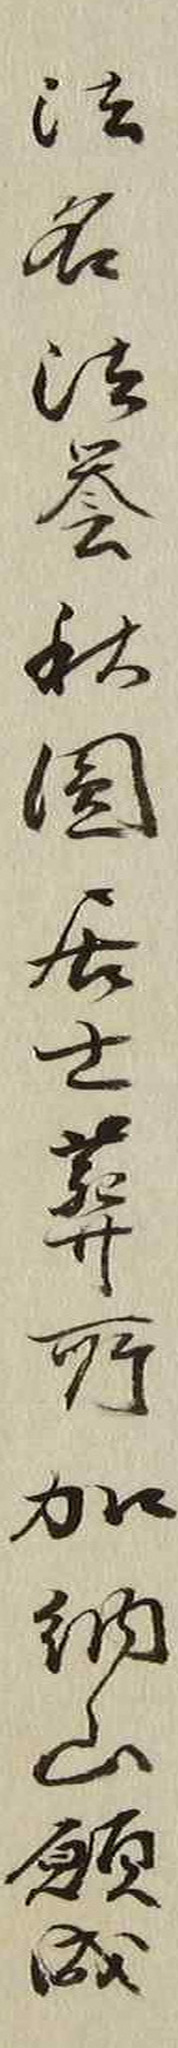法名法誉秋円居士葬所加納山願成
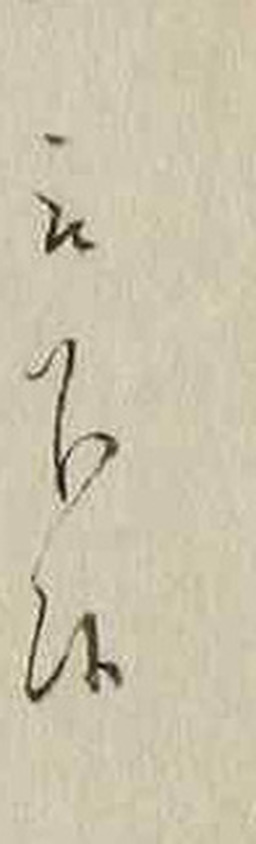被下候
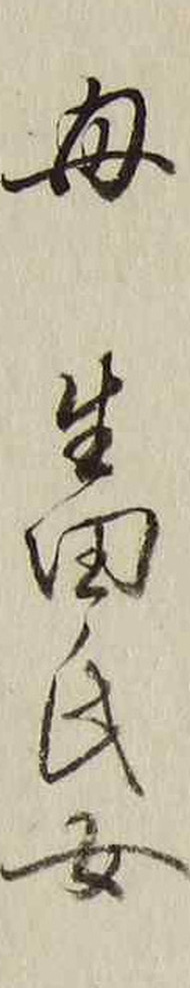母生田氏女

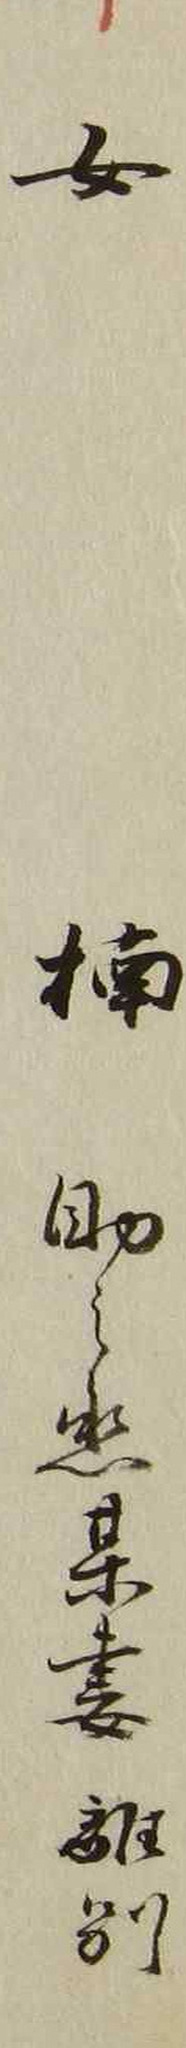女楠助之丞某妻離別
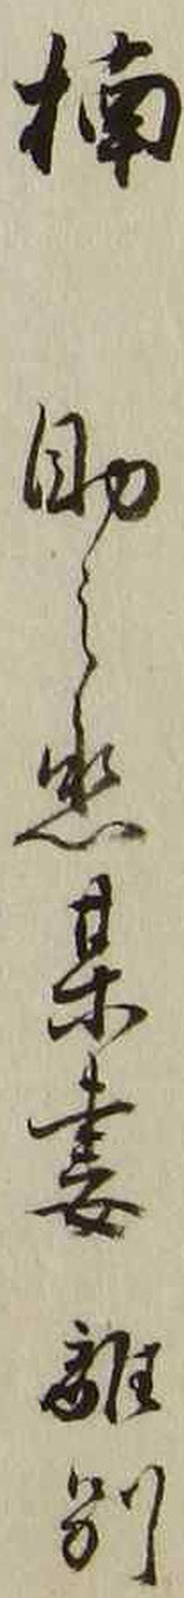女楠助之丞某妻離別
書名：諸士系譜　巻之4　い之部4
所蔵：会津若松市立会津図書館
